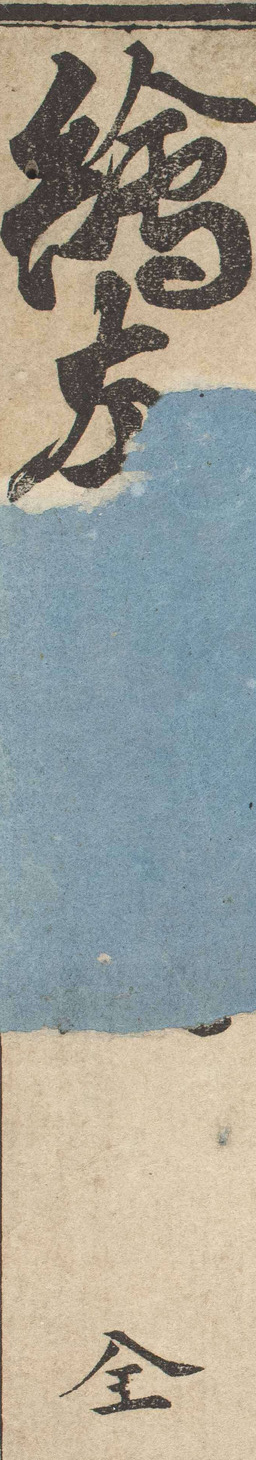絵本全

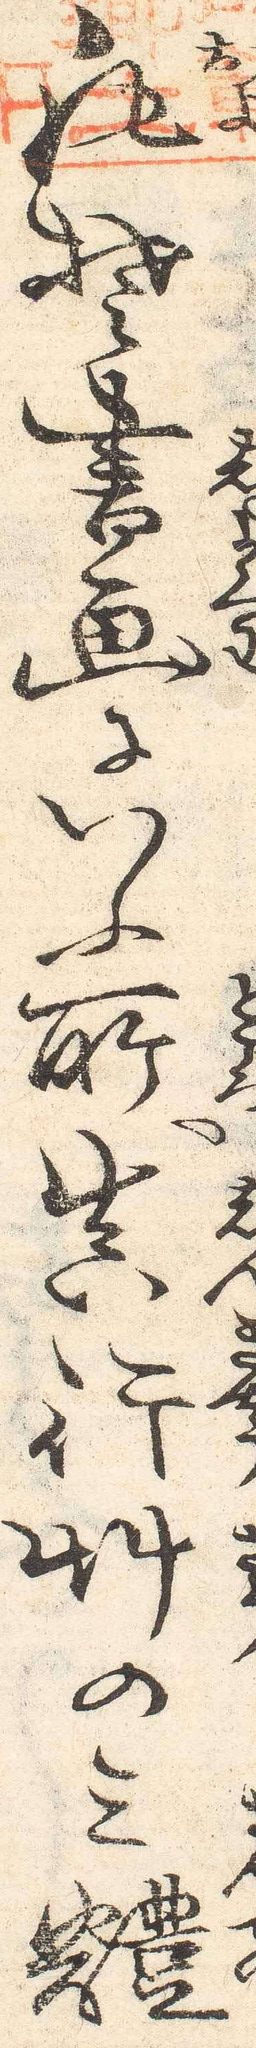凡そ書画にいふ所。真行草の三体
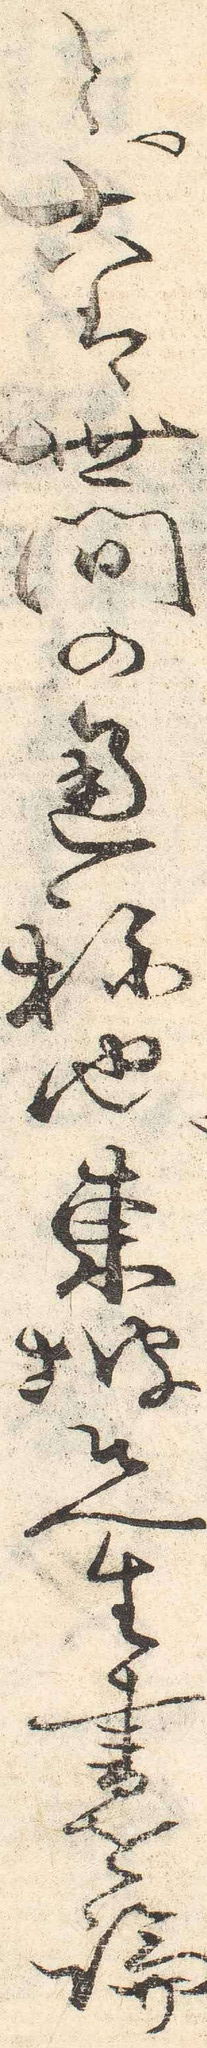と。こは世間の通称也。東坡先生書を論
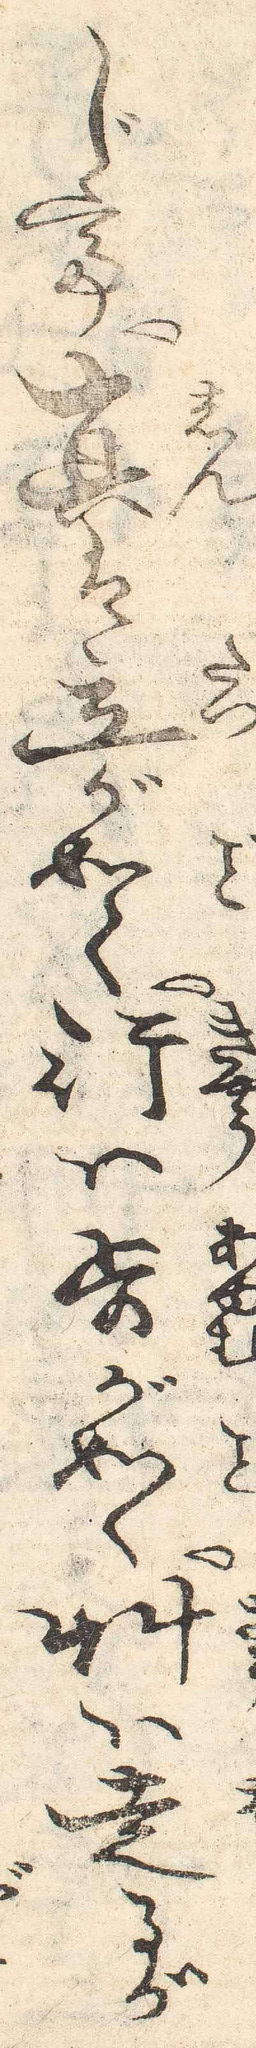じて。真は立が如く。行は歩が如く。草は走るが
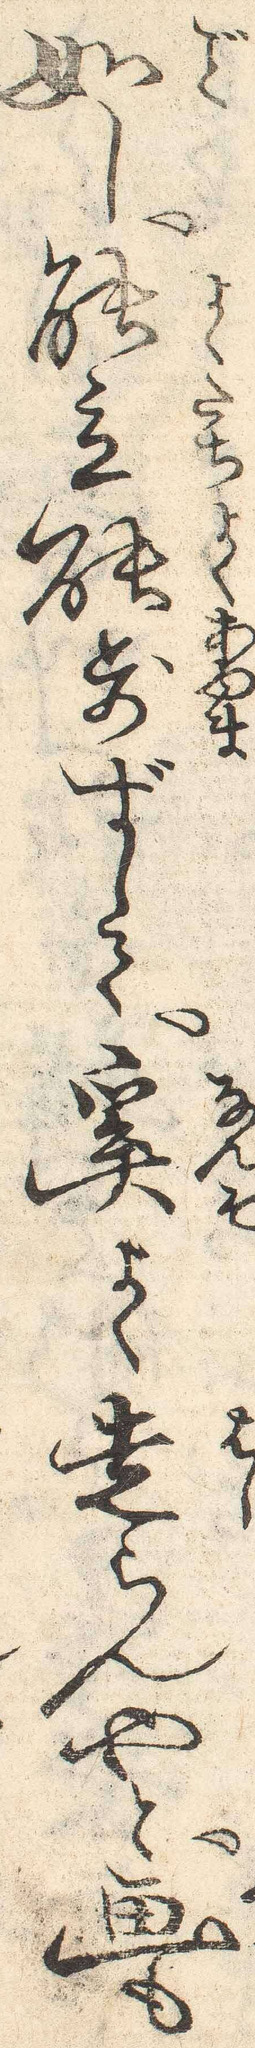如し。能立能歩ずして。奚よく走らんやと。画も
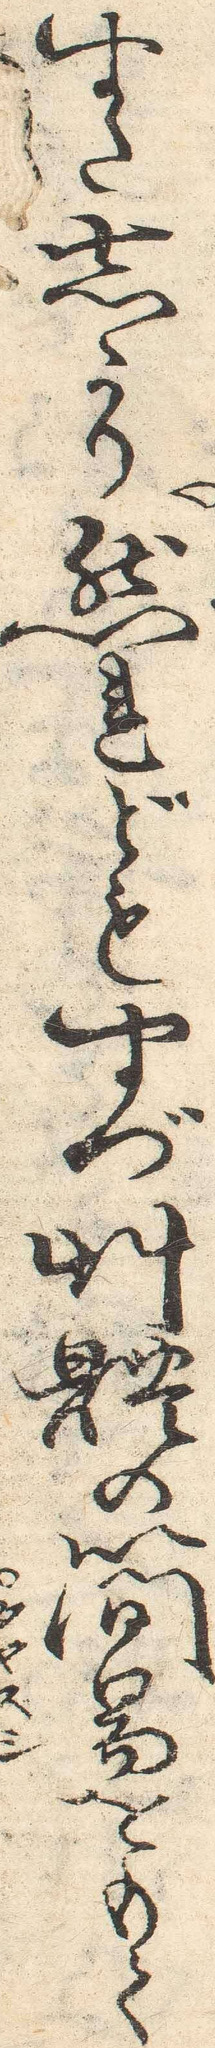またしかり。然れどもまづ草体の簡易をもて。

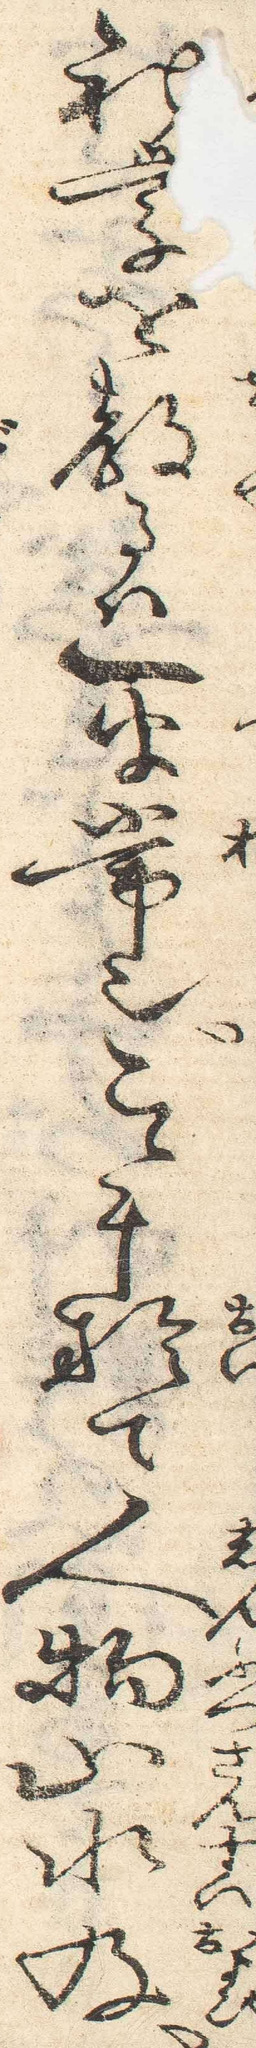初学を教るは平常也。こゝに於て人物山水及。
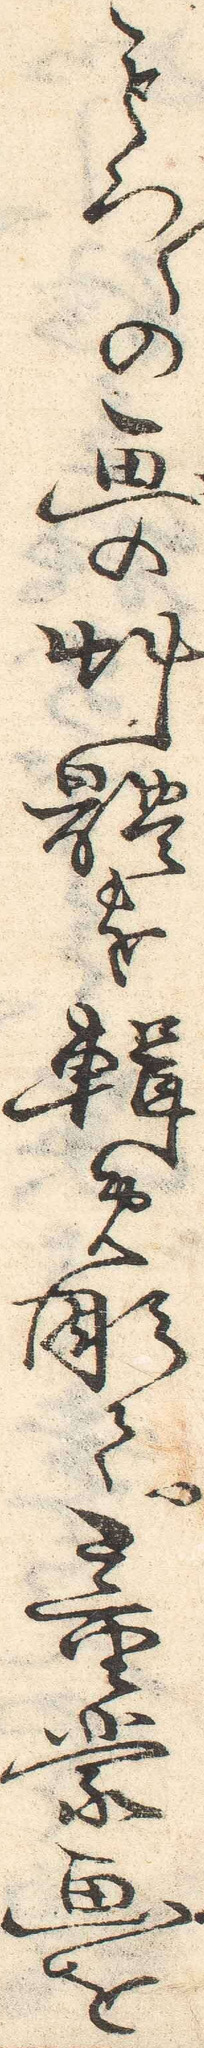もろ〳〵の画の草体を輯め彫て。童蒙画を
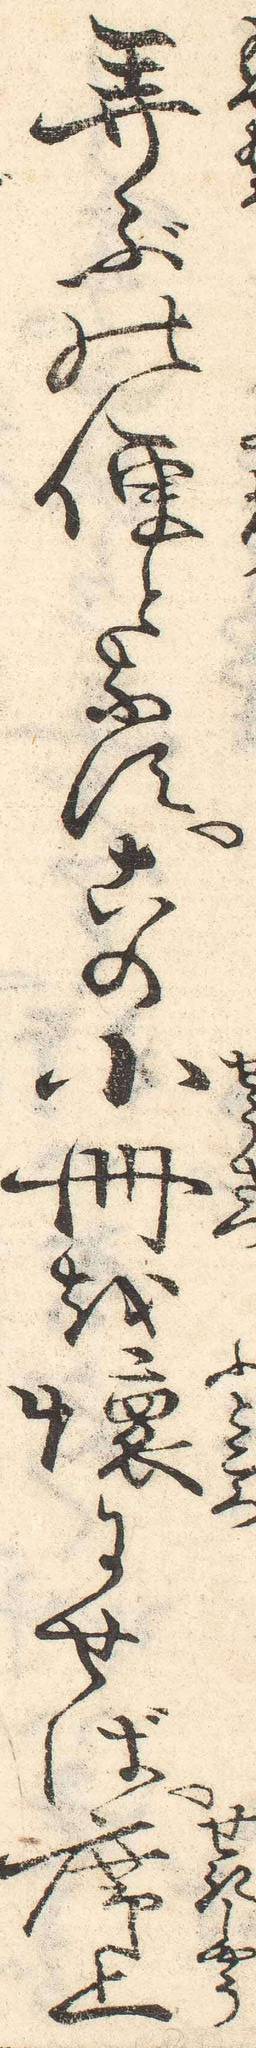弄ぶの便となす。この小冊を懐にせば。席上
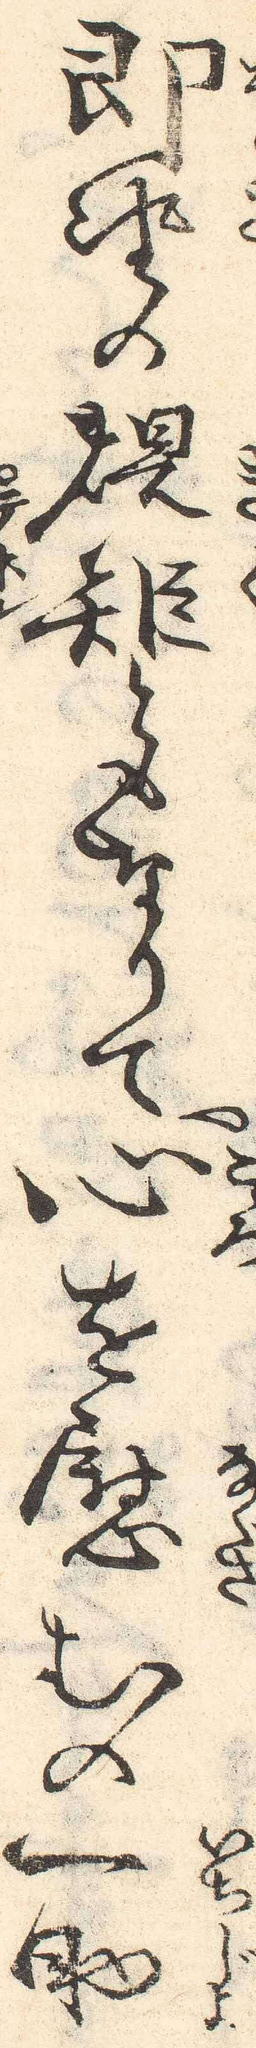即座の規矩ともなりて。心を慰むの一助
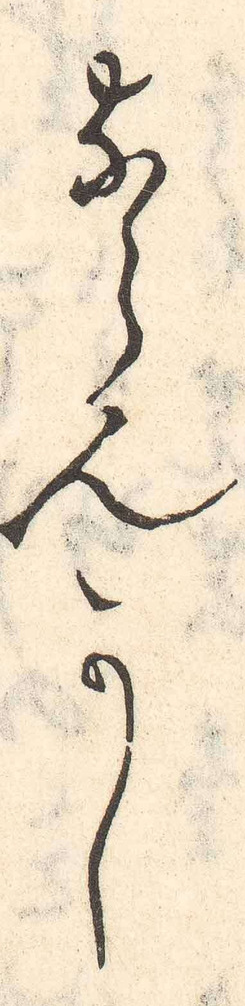ならんかし
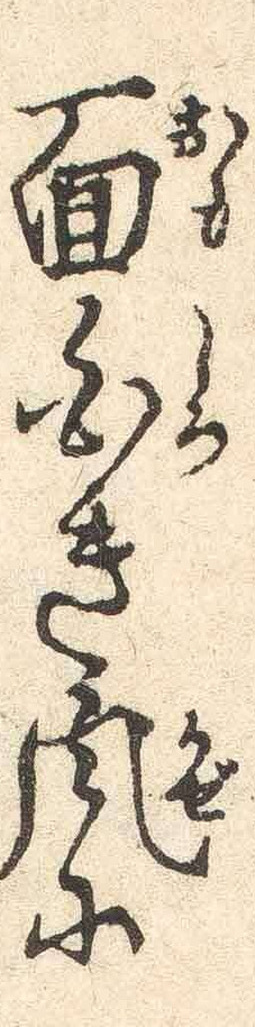面白き風に
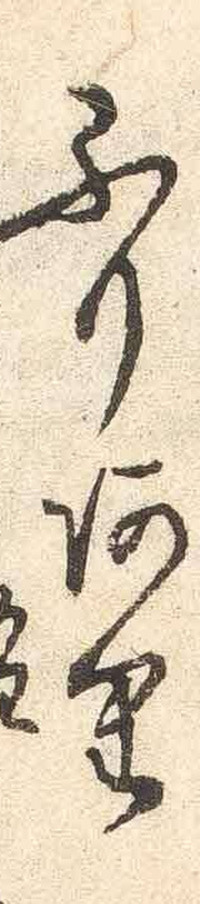ふりあり
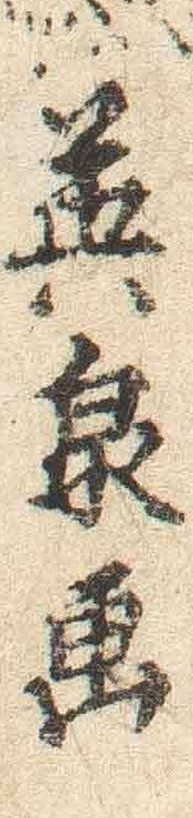英泉画

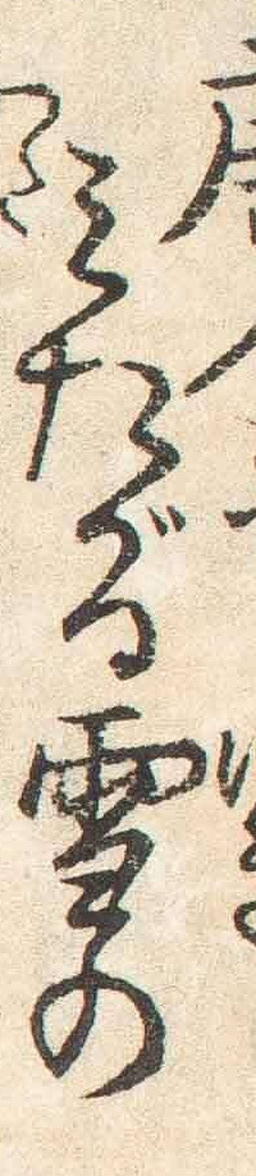みたがる雪の
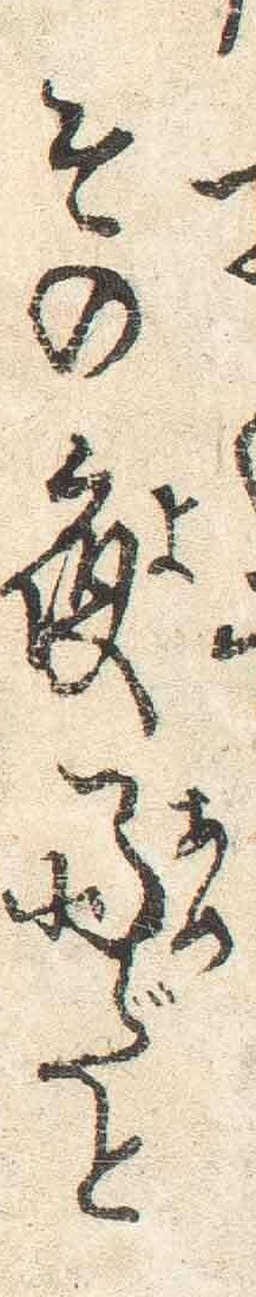その夜雨だと
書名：画本柳樽
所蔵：東京学芸大学附属図書館 国文学研究資料館
